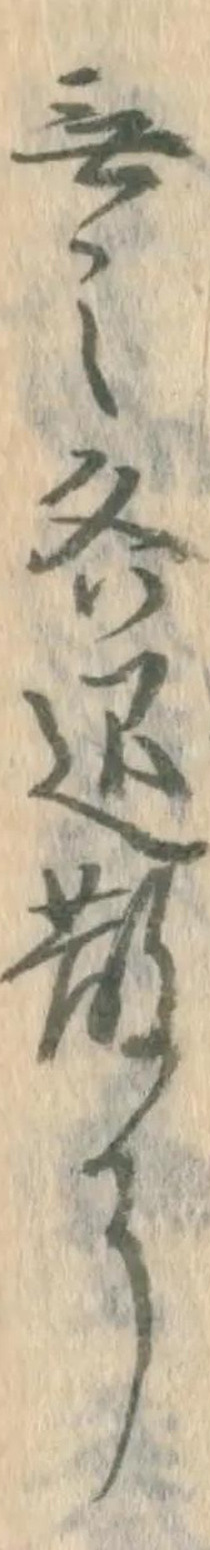無之各退散了、

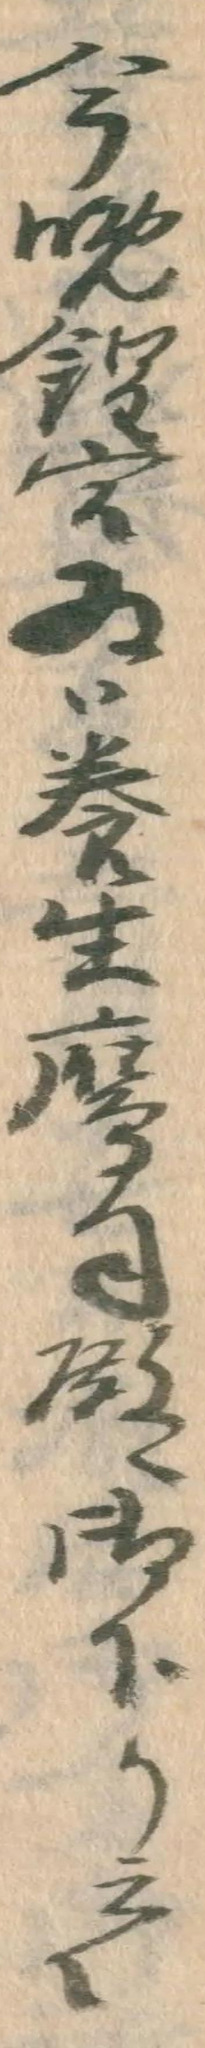今晩鍠宮為御養生、鷹司殿へ御下り云々、
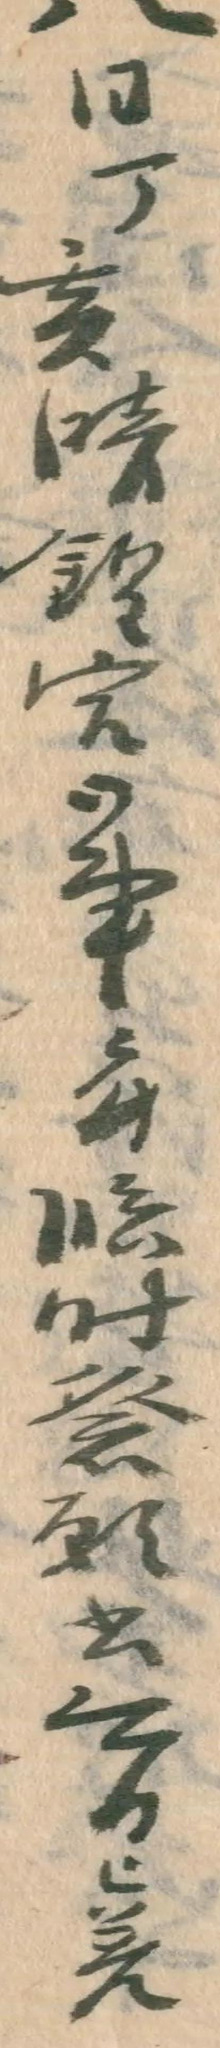八日丁亥晴、鍠宮御事ニ付、臨時祭願書、今日被差
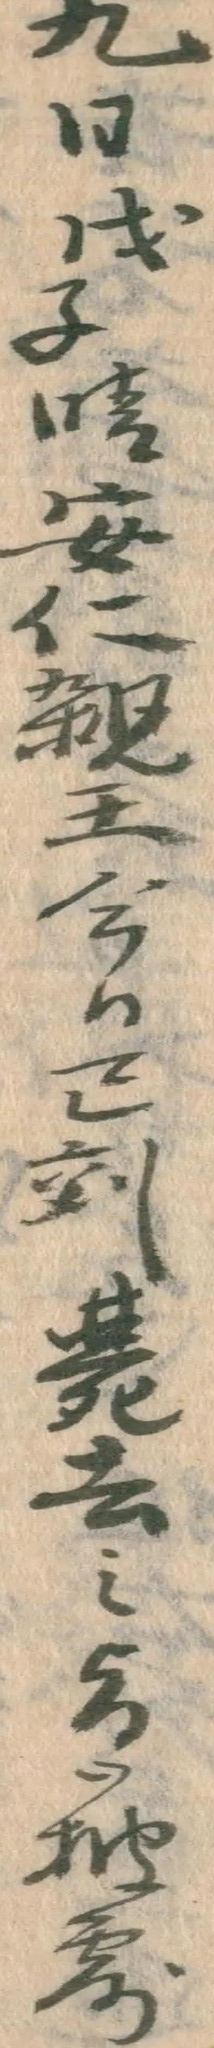九日戊子晴、安仁親王今日巳刻薨去之旨御披露
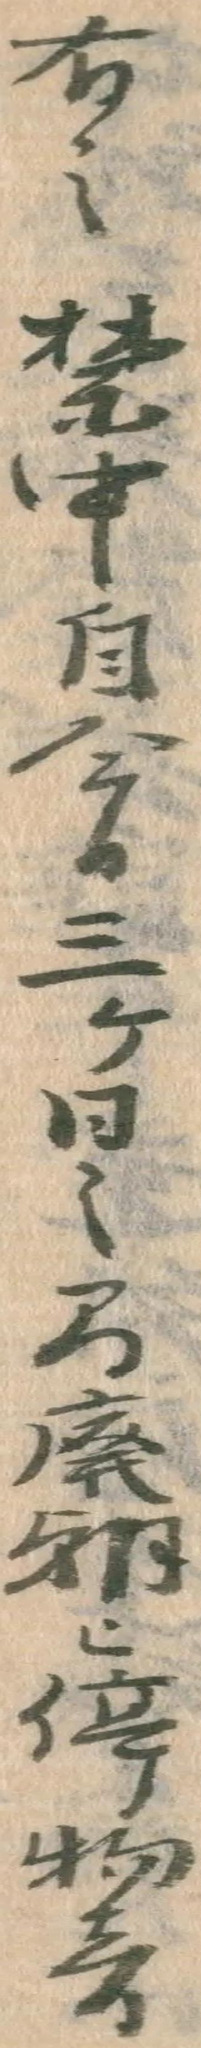有之、禁中自今日三ケ日之間廃朝被停物音
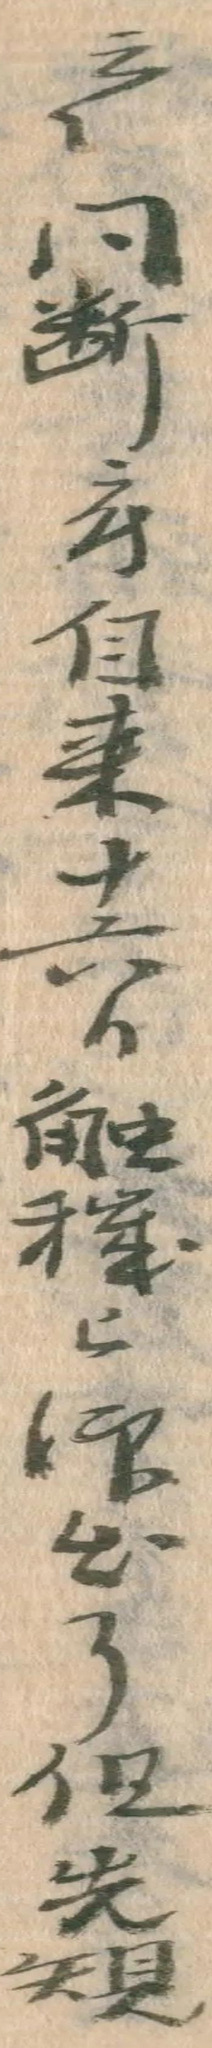云々、同断ニ付、自来十六日触機被仰出了、但先規
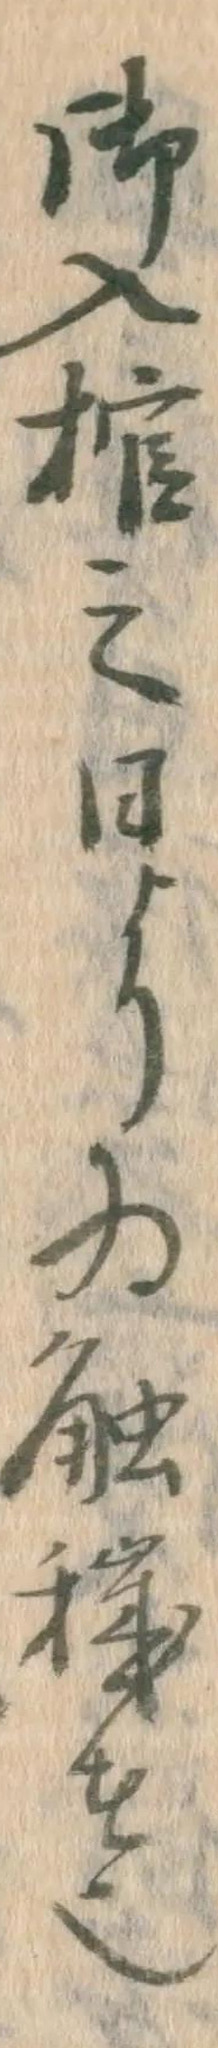御入棺之日より為触穢者也、
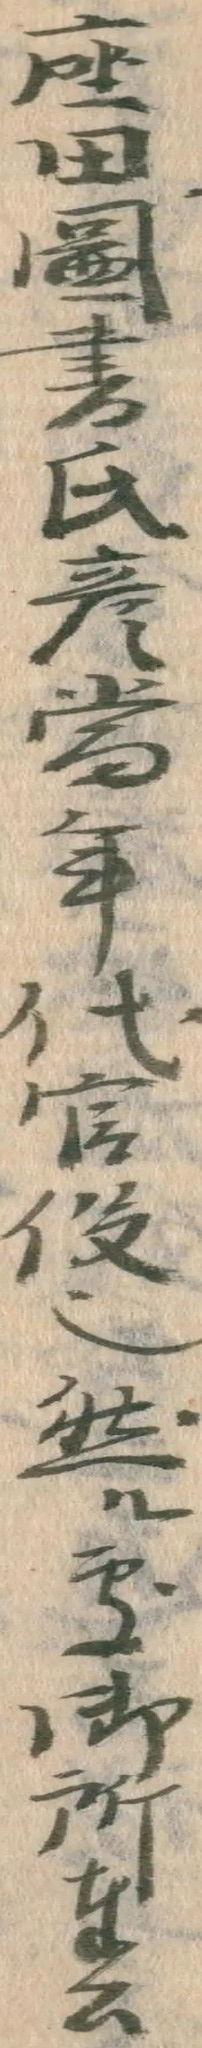座田圖書氏彦當年代官役也、然ル處、御所奉公
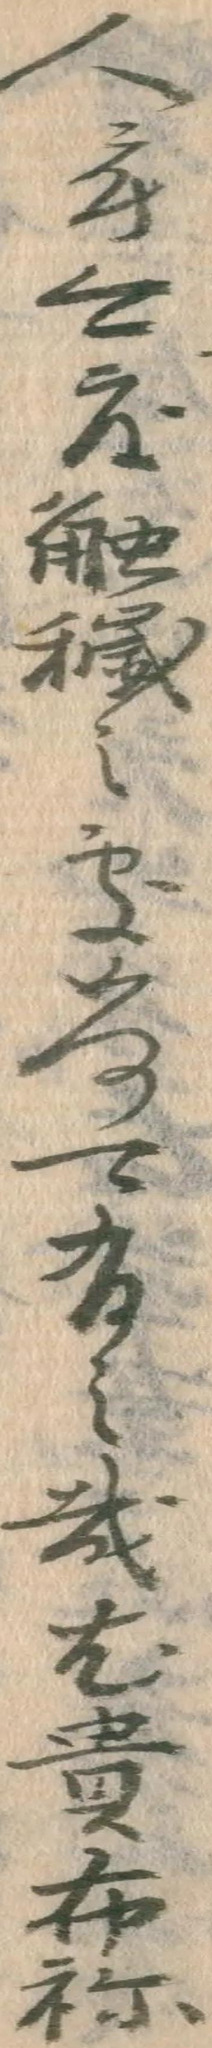人ニ付、今度触穢之處如何可有之哉、尤貴布祢
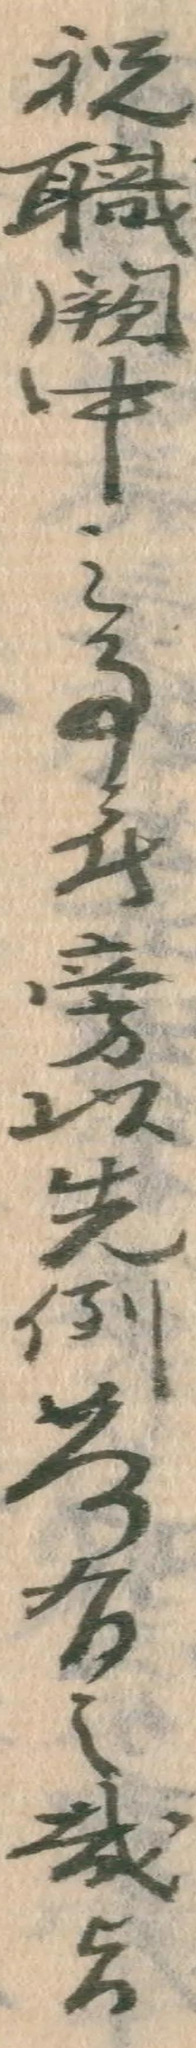祝職闕中之事ニ付、旁以先例如何有之哉旨、
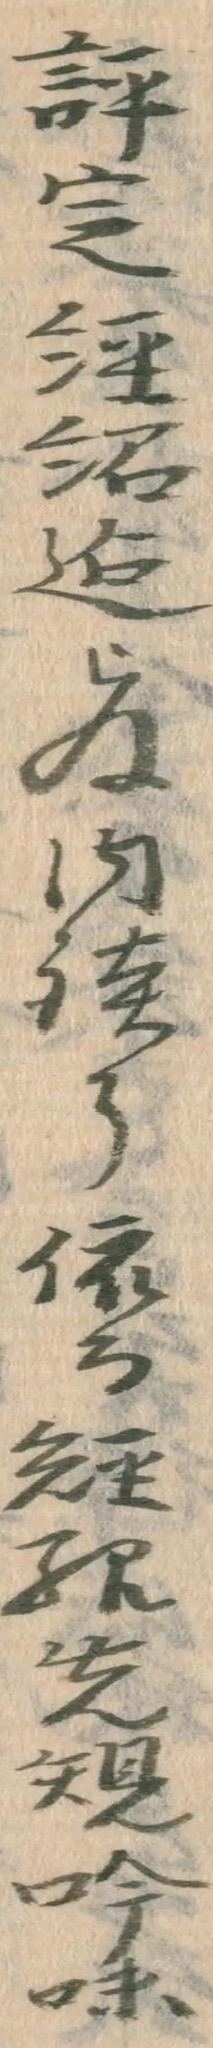評定経紹迄被及内談了、依而経紹先規吟味
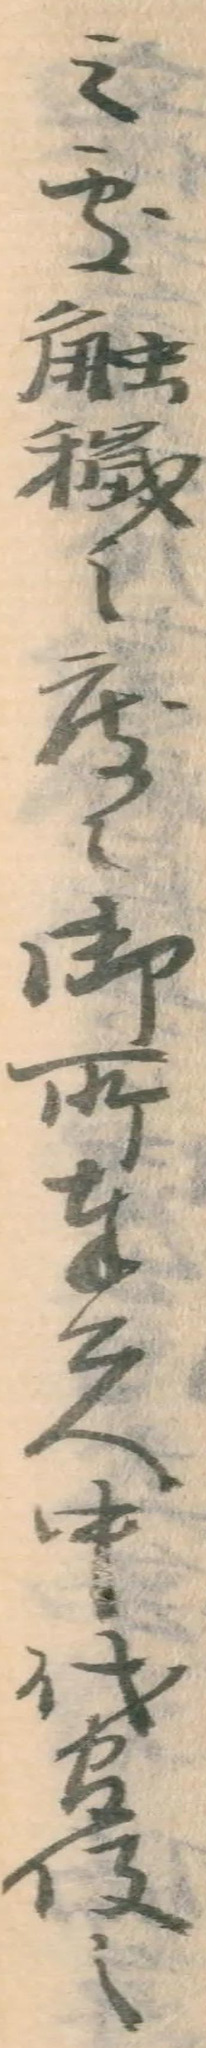之處、触穢也、度々御所奉公人中代官役之
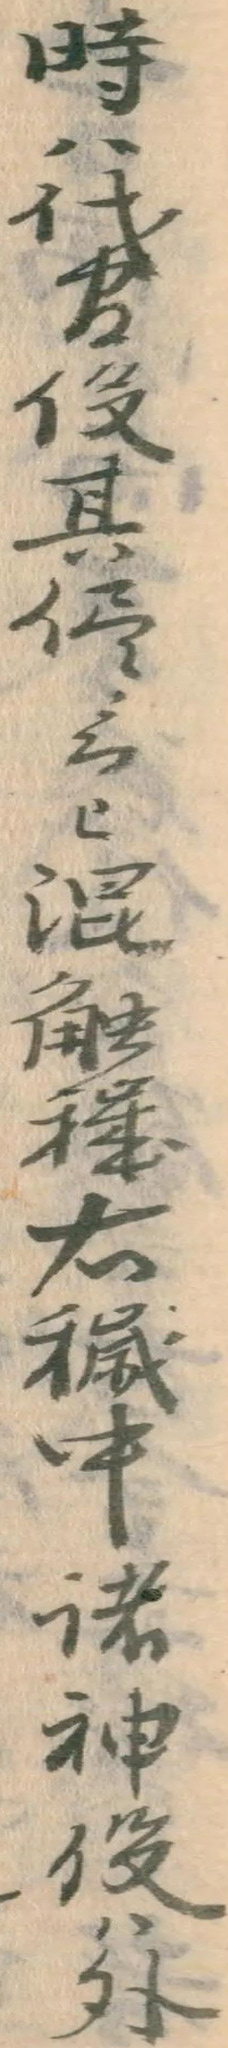時ハ代官役其侭ニ而、被混触穢、右穢中、諸神役ハ外
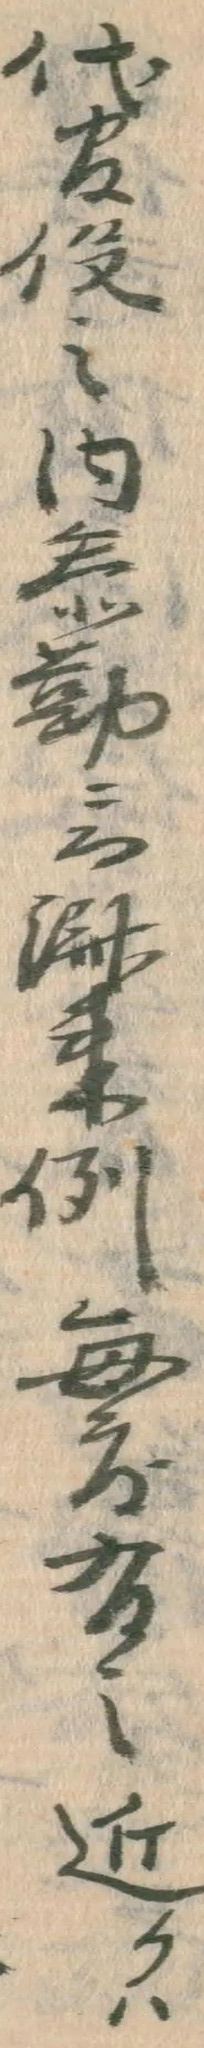代官役之内参勤ニ而済来例毎度有之、近クハ
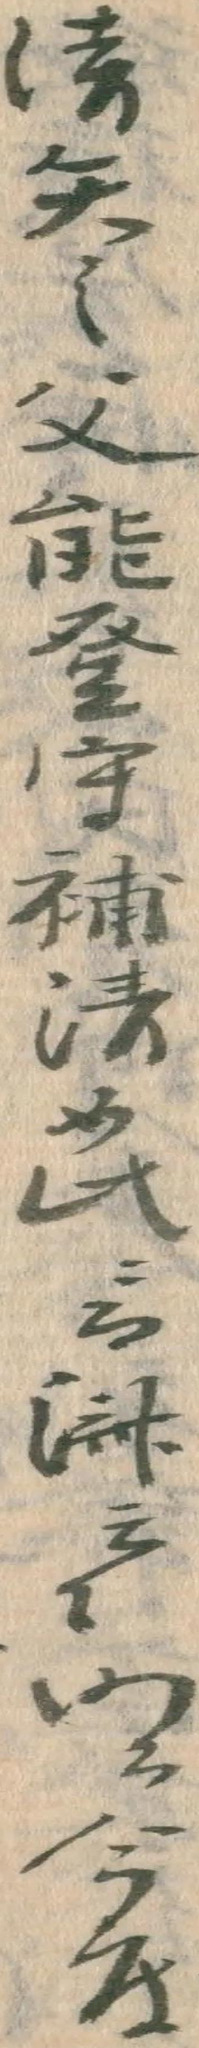清矢之父能登守補清如此ニ而済云々、仍而今度
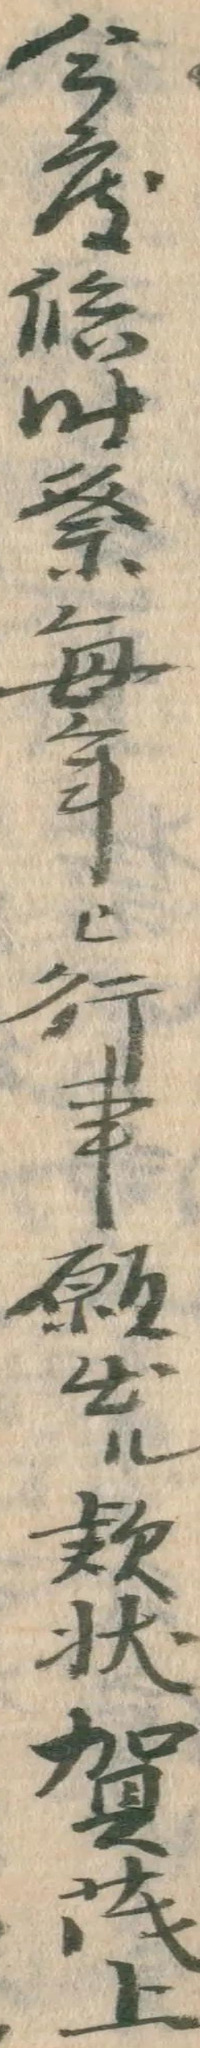今度臨時祭毎年被行事願出ル歎状、賀茂上
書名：賀茂社記録. 第63冊
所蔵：国立国会図書館 National Diet Library, JAPAN
